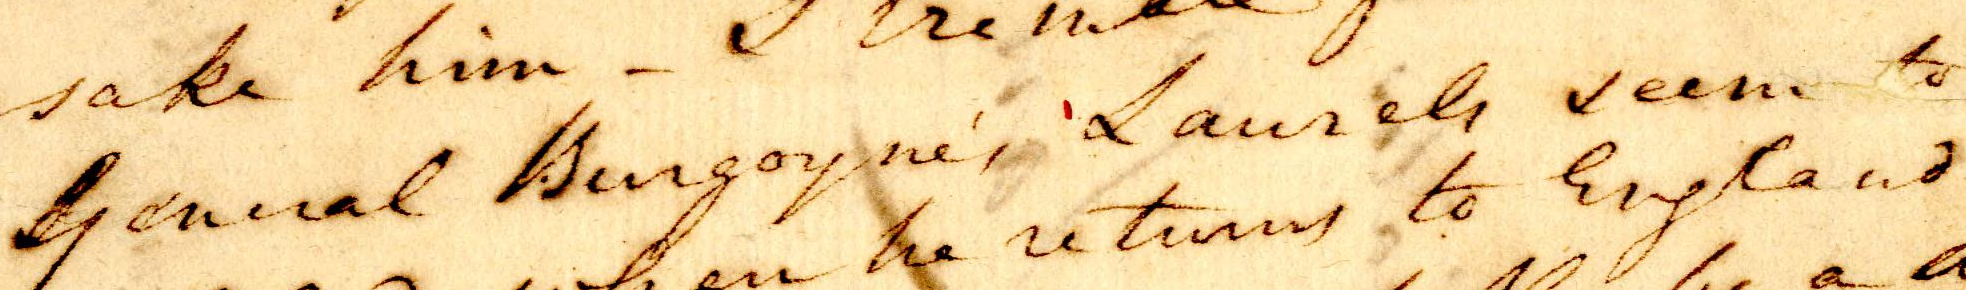General Burgoyne's Laurels seem to
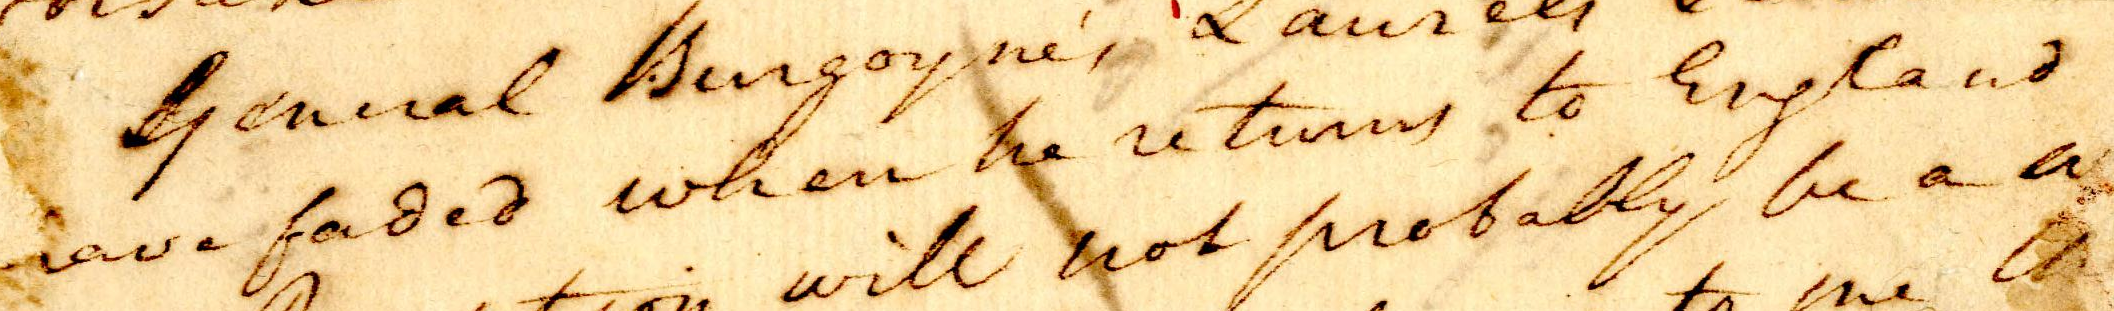have faded when he returns to England
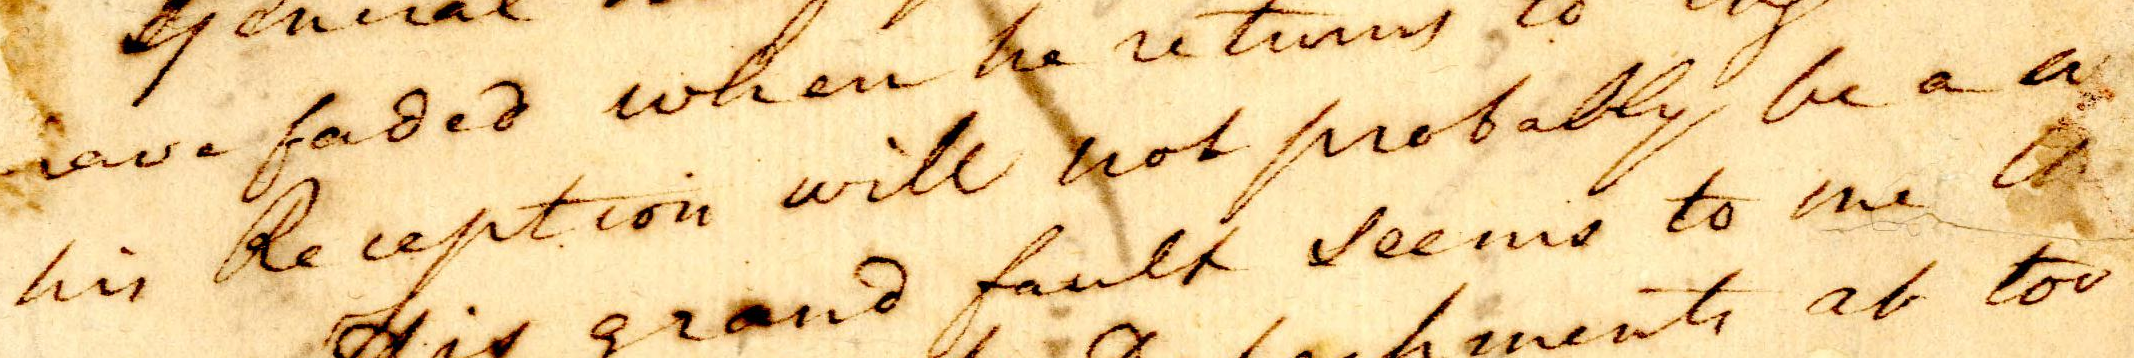his Reception will not probably be a a
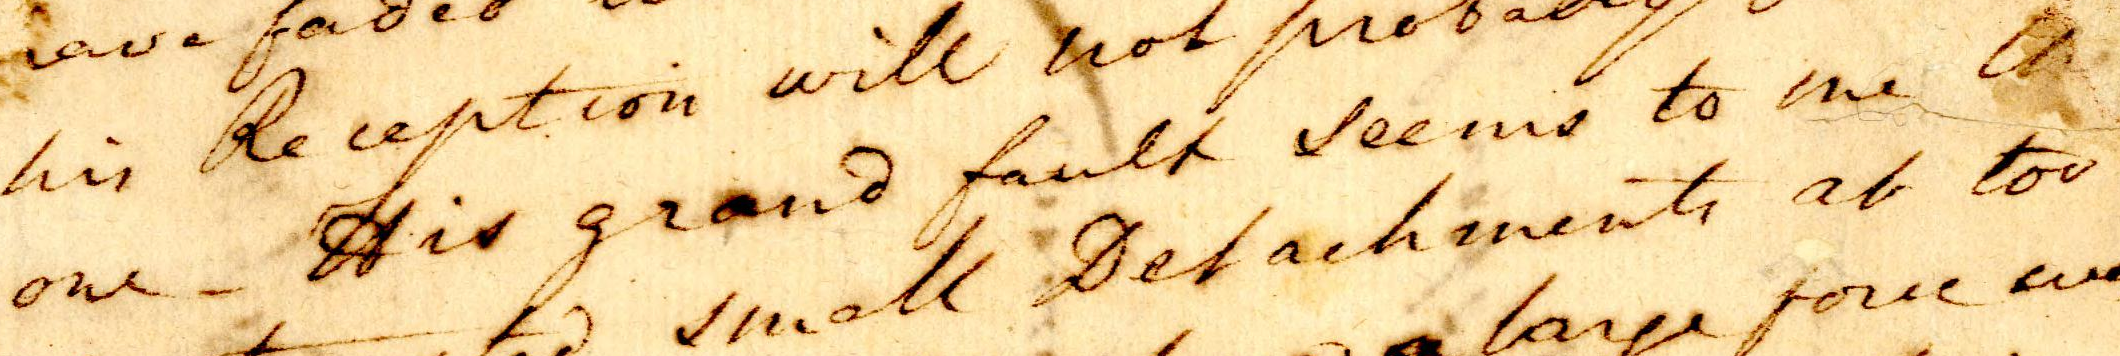one- His grand fault seems to me a
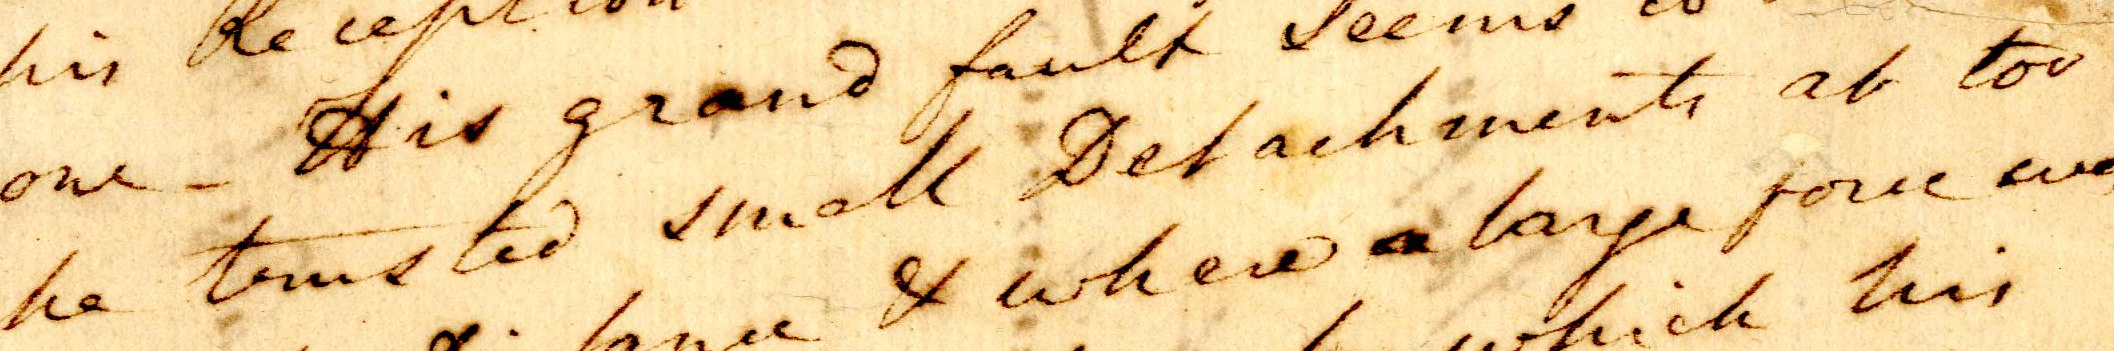he trusted small Detachments at too
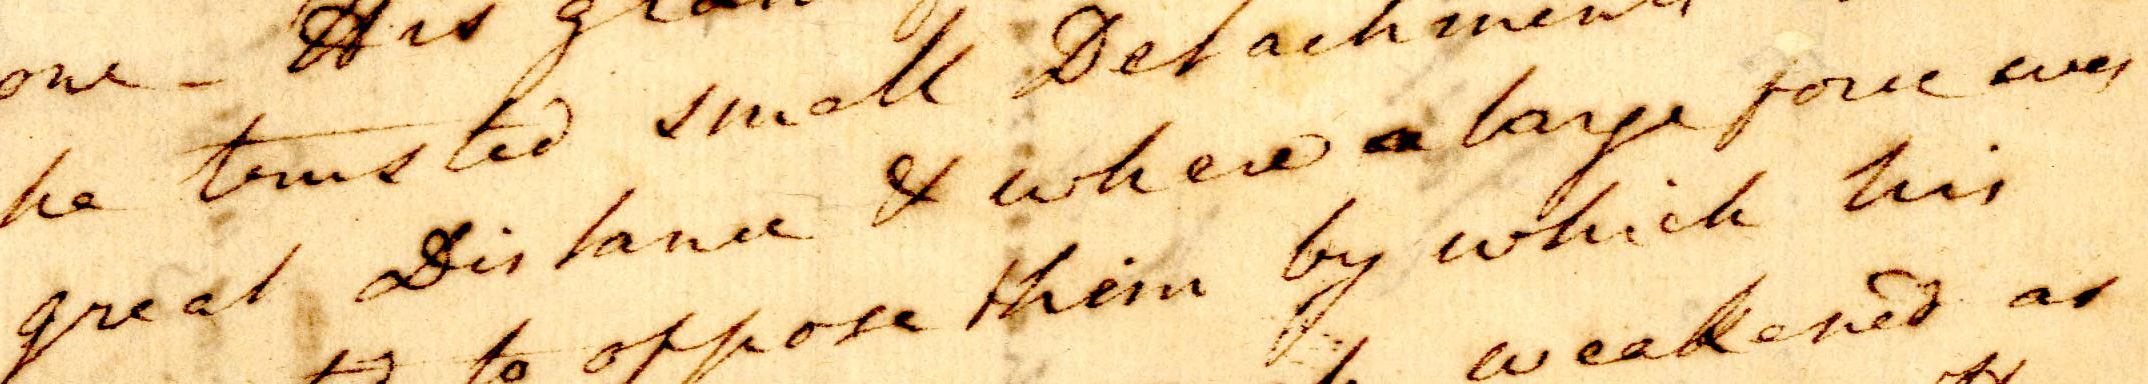great Distance & where a large force was
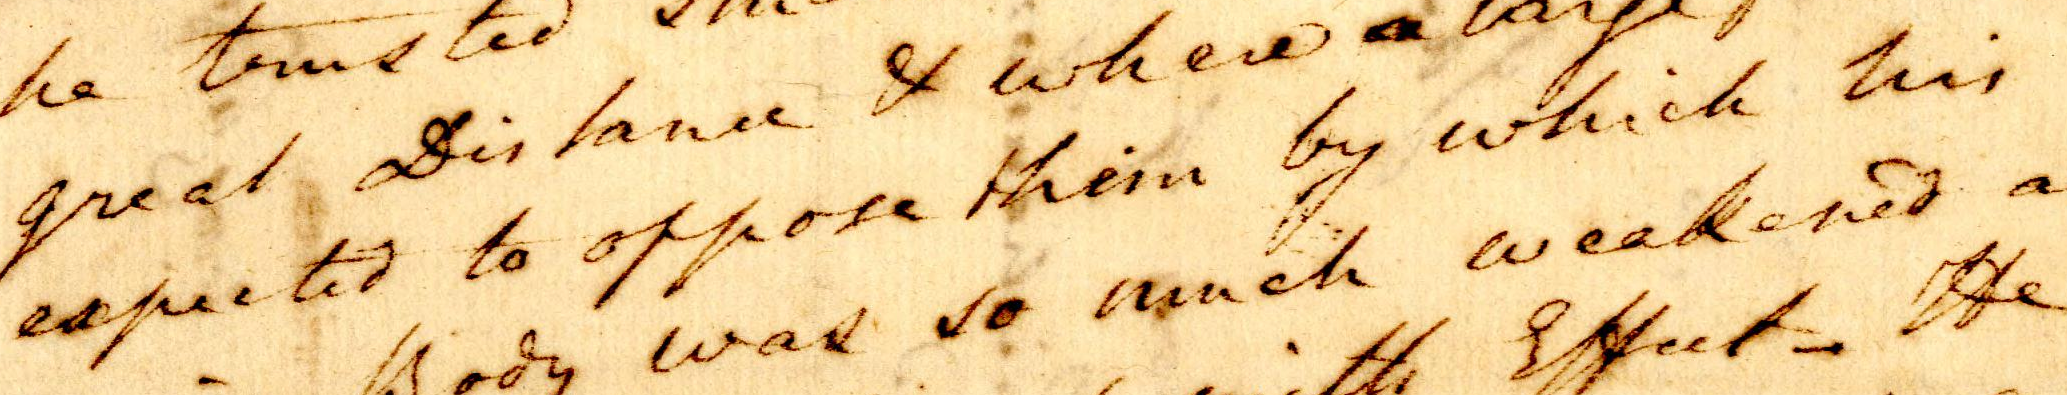expected to oppose them by which his
